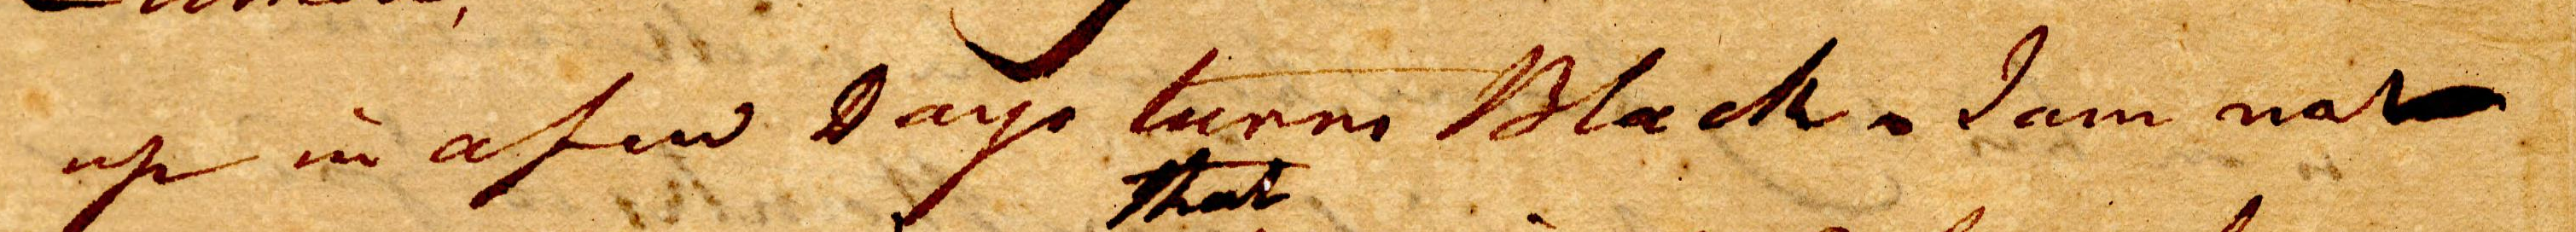up in a few Days turns Black. I am not
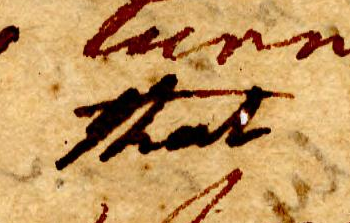that
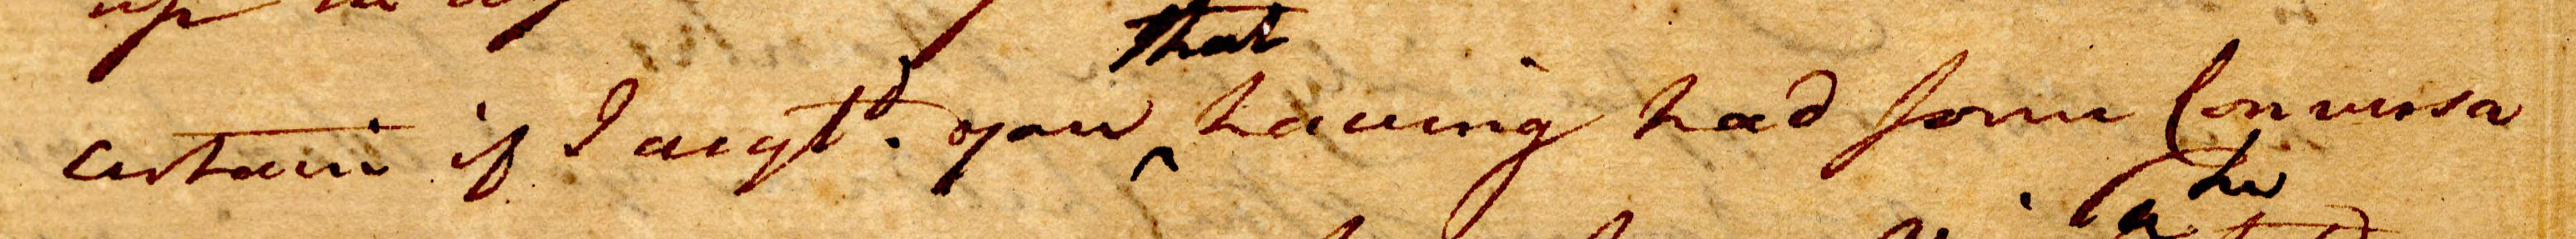certain if I acqt^d you having had some Conversa-
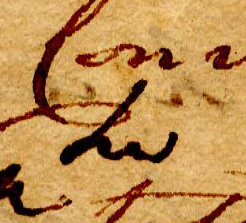he
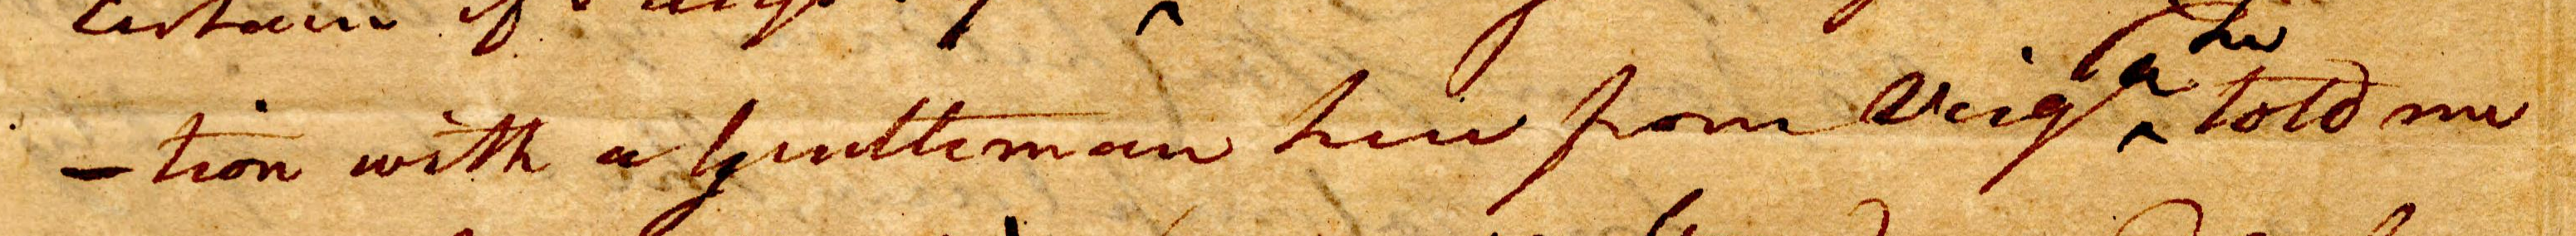-tion with a gentleman here from Virg^a. told me
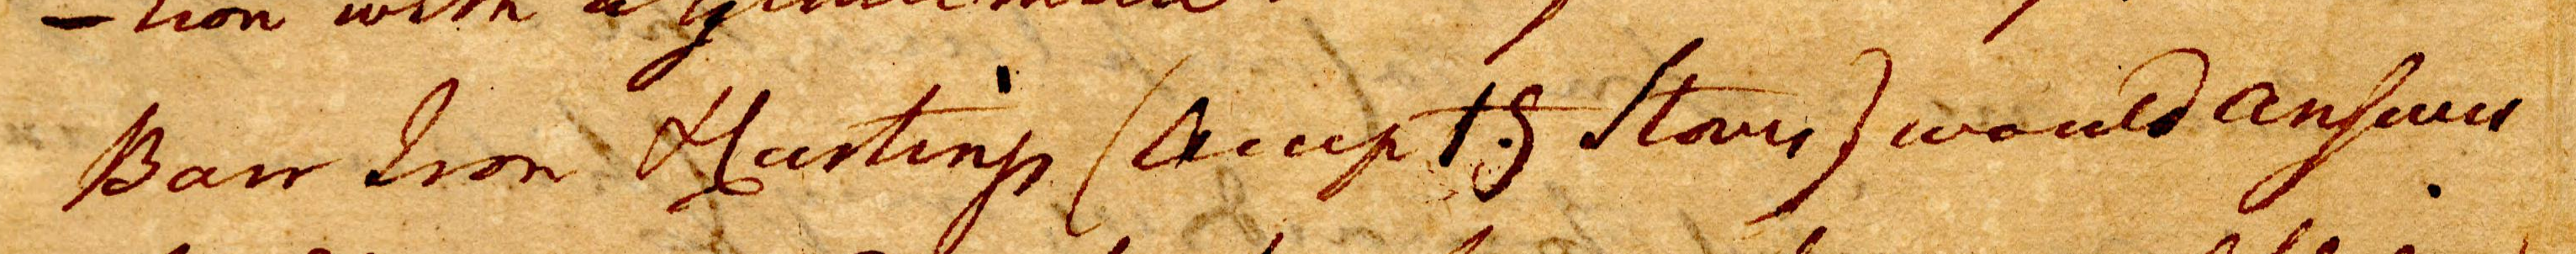Barr Iron & Curtings (Acceptg Stoves) would answer
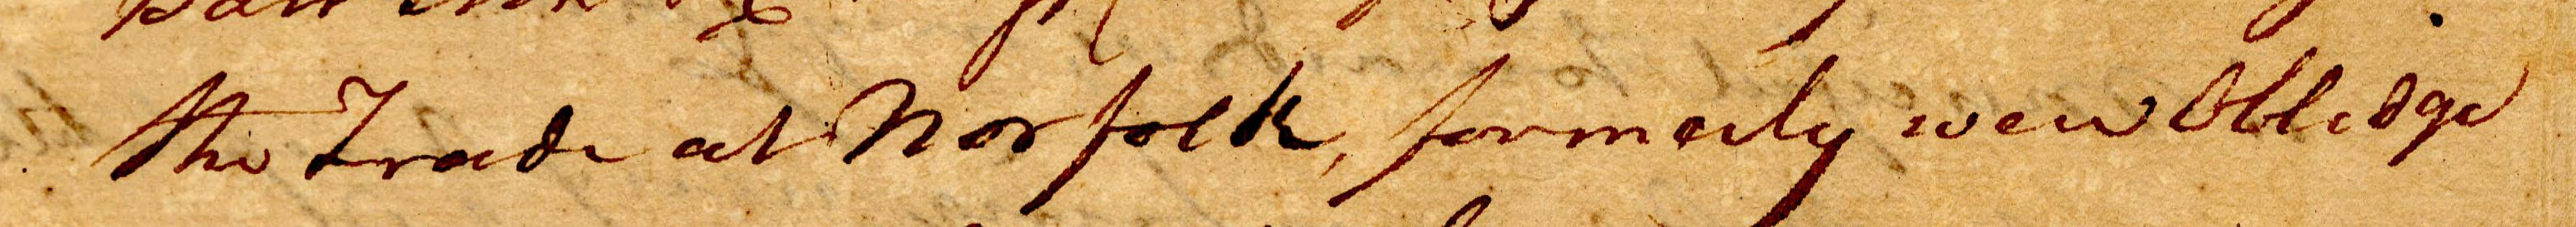the Trade at Norfolk, formerly were Oblidge
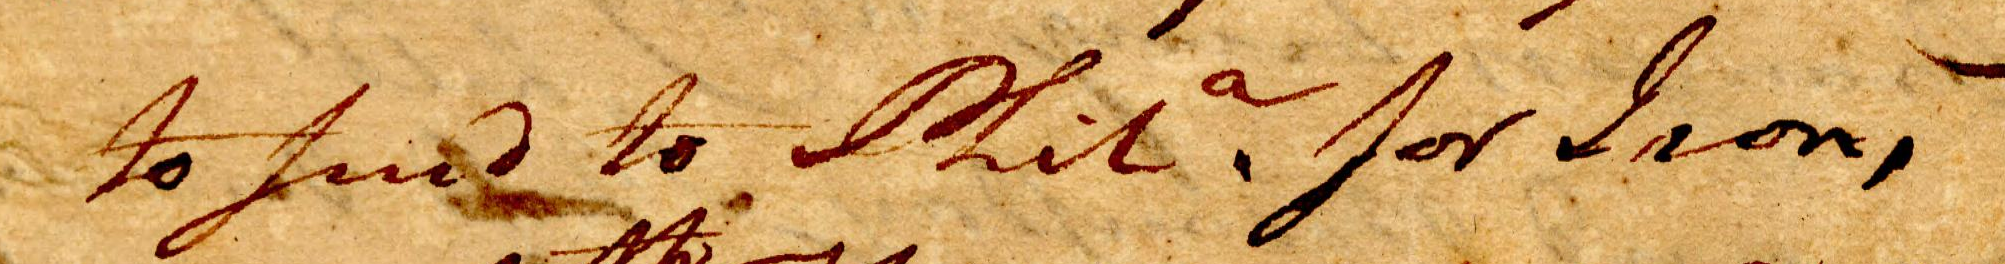to send to Phil^a for Iron,
